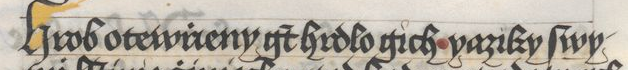Hrob otewṙieny ḡt hrdlo gich.yaziky ſwy¬
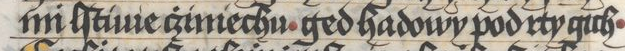mi lſtivie cžiniechu.ged hadowy pod rty gich.
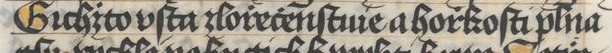Gichżto uſta zloṙeċenſtvie a hoṙkoſti plna
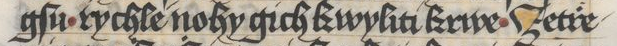gſu.rychlé nohy gich kwylití krwe.Zetṙe¬
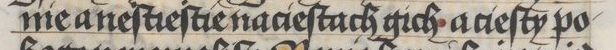nie a neẛtieẛtie na cíeſtach gich.a cíeſty po¬
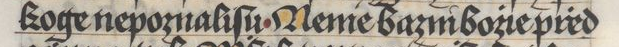koge nepoznaliſu.Neníe bazni bożie pṙed
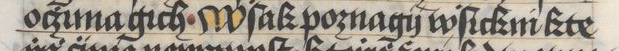ocżima gich.Wẛak poznagij wẛickni kte¬
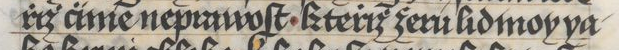ṙiż ċinie neprawoſt.kteṙiż żerú lid moy ya¬
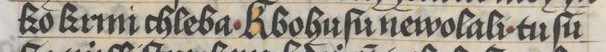ko krmi chleba.K bohu ſu newolali.tu ſu
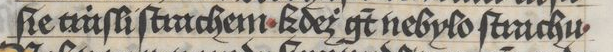ſie tṙaſli ſtrachem.kdeż ḡt nebylo ſtrachu.
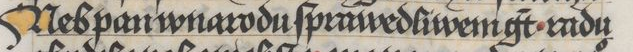Neb pan wnarodu ſprawedliwem ḡt.radu
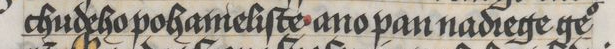chudeho pohanieliſte.ano pan nadiege geo
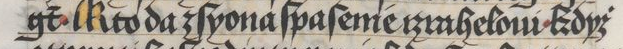ḡt.Kto da zſyona ſpaſeníe izrahelovi.kdyż
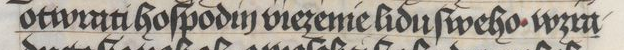otwrati hoſpodin viezeníe lidu ſweho.wzra¬
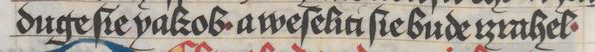duge ſie yakob.a weſeliti ſie bude izrahel.
